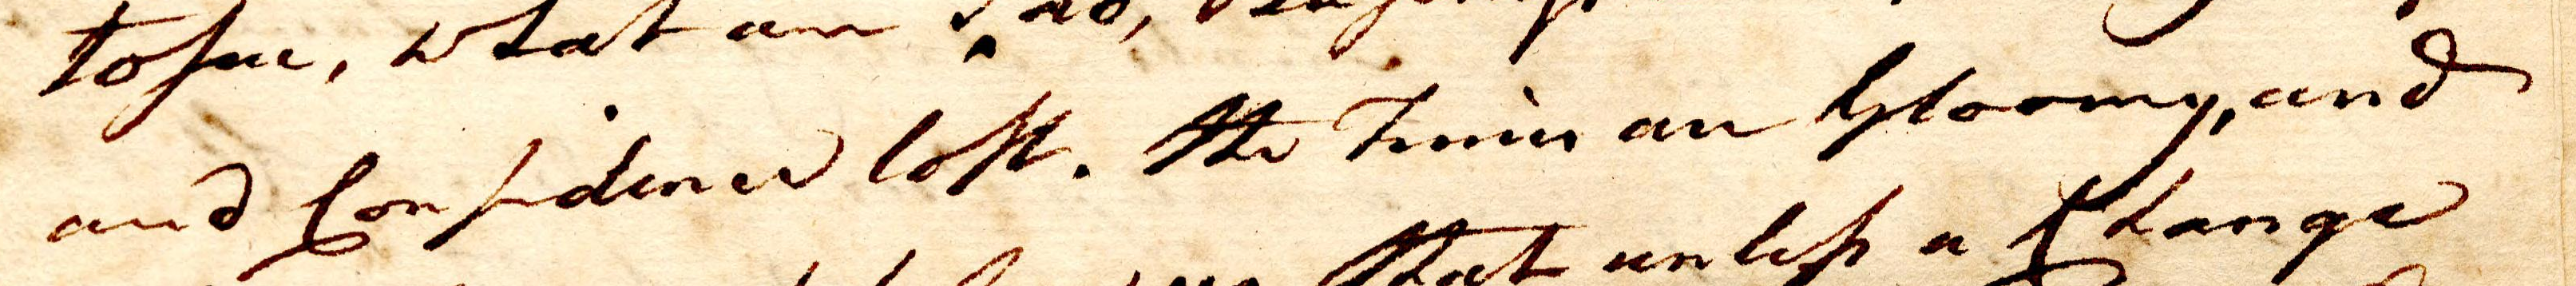and Confidence lost. the times are Gloomy, and
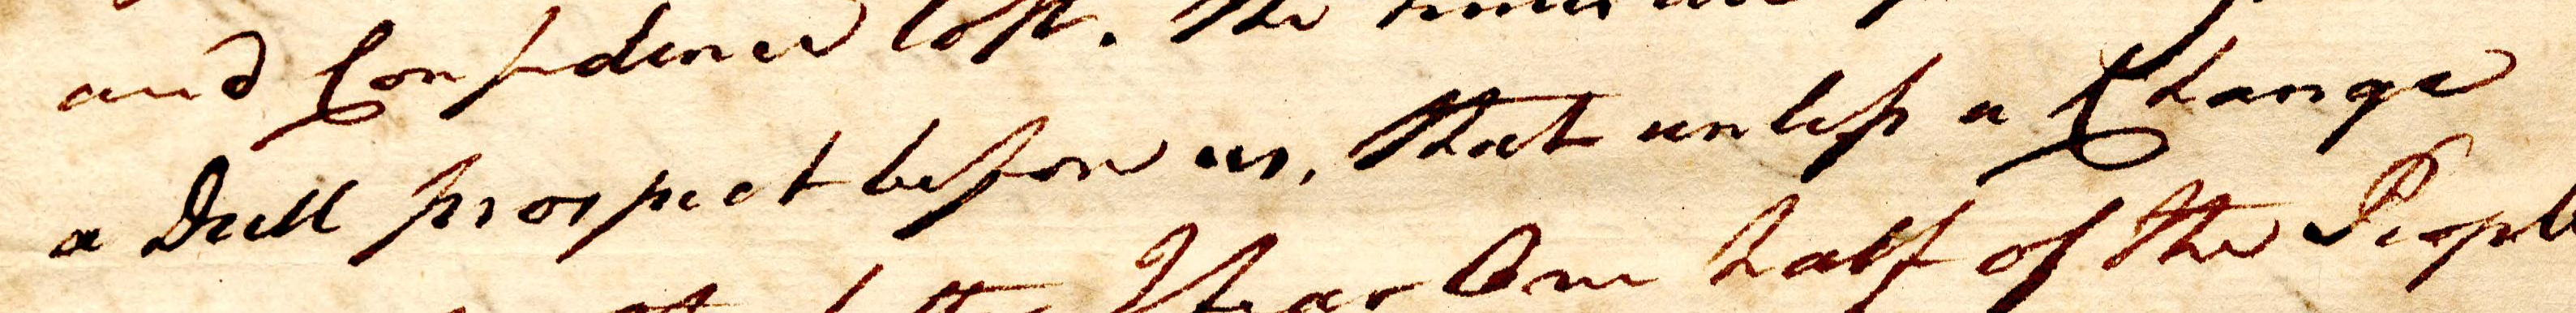a Dull prospect before us, that unless a change
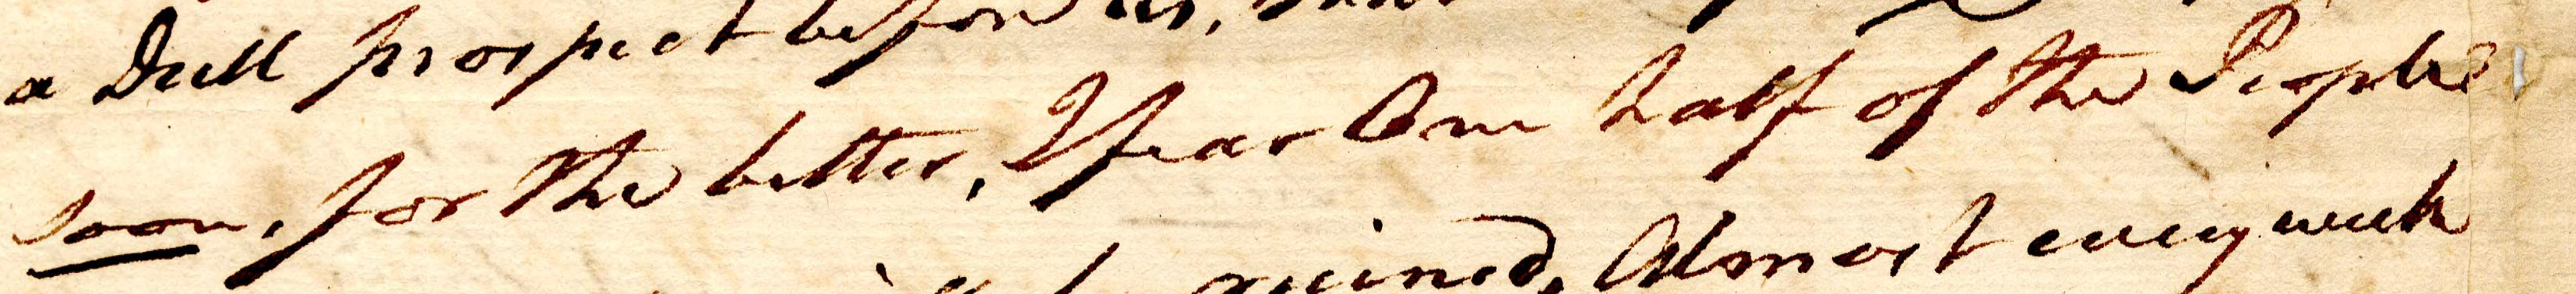soon for the better, I fear am half of the People
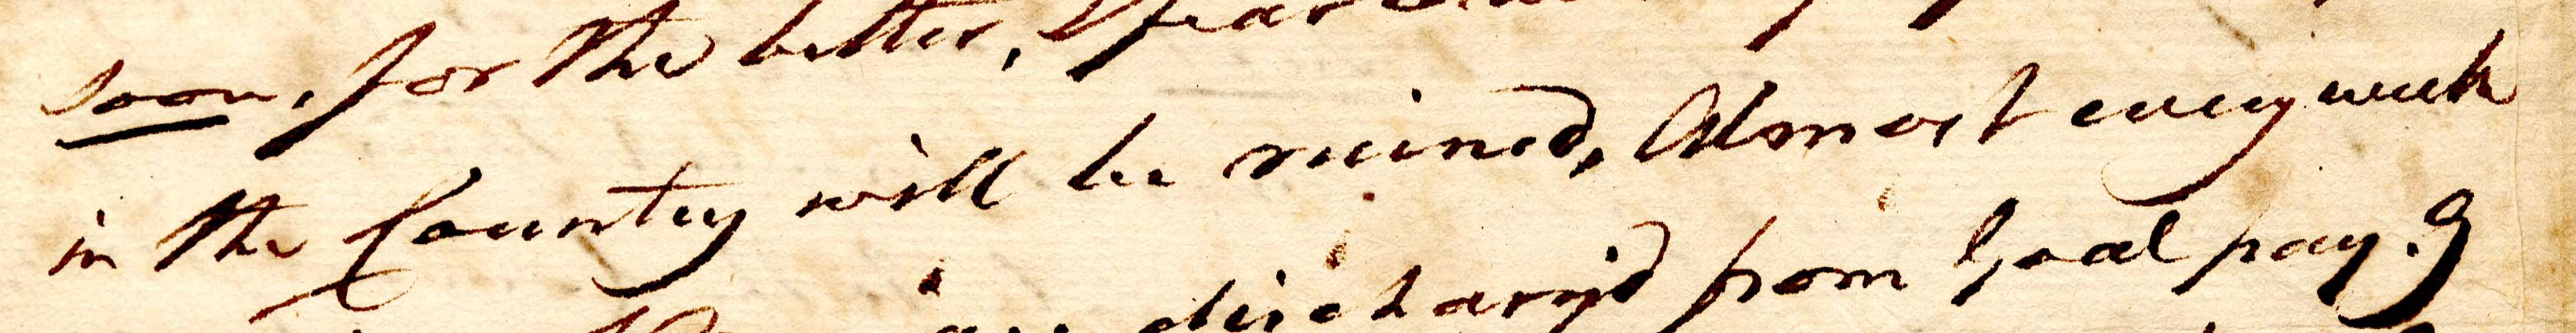in the Country will be ruined, Almost every week
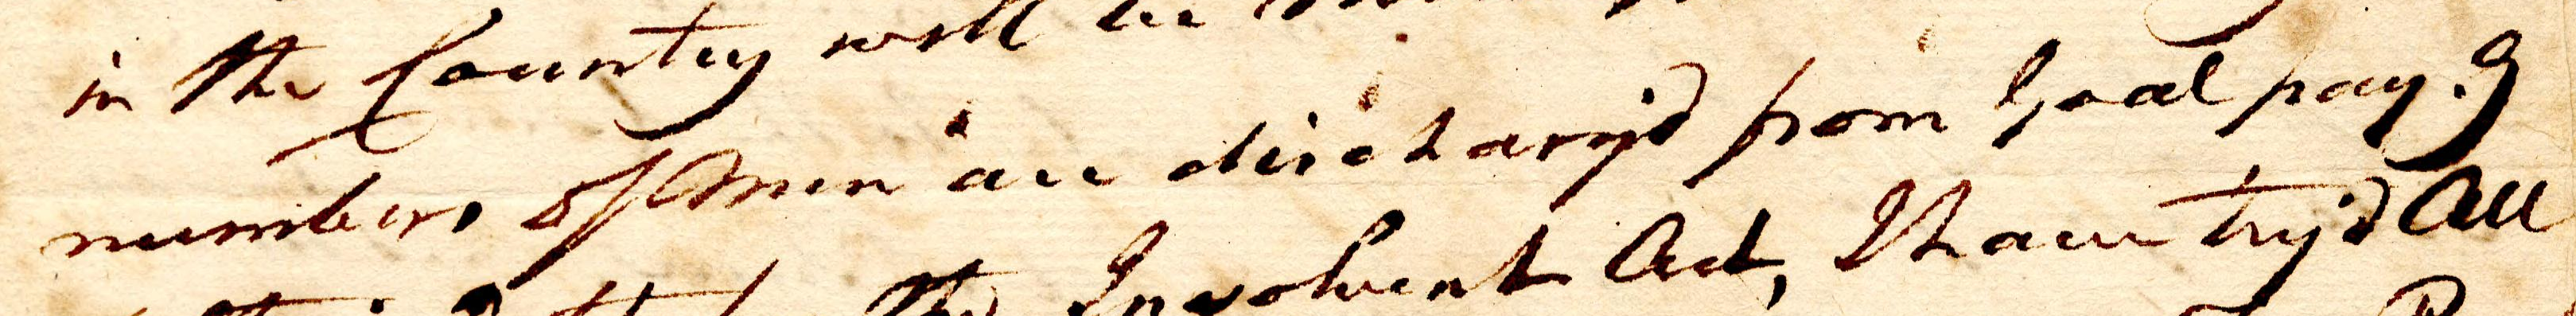numbers of men are discharg'd from Gaol pay^g.
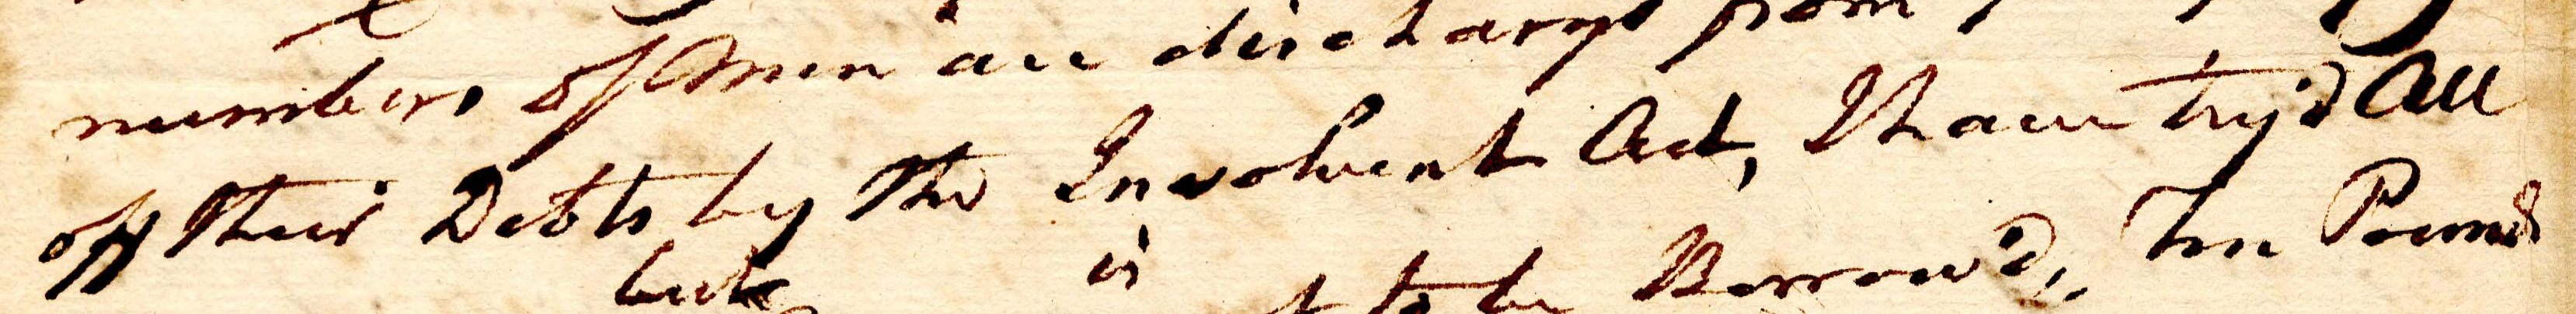off their Debts by the Insolvent Act, I have try'd all
